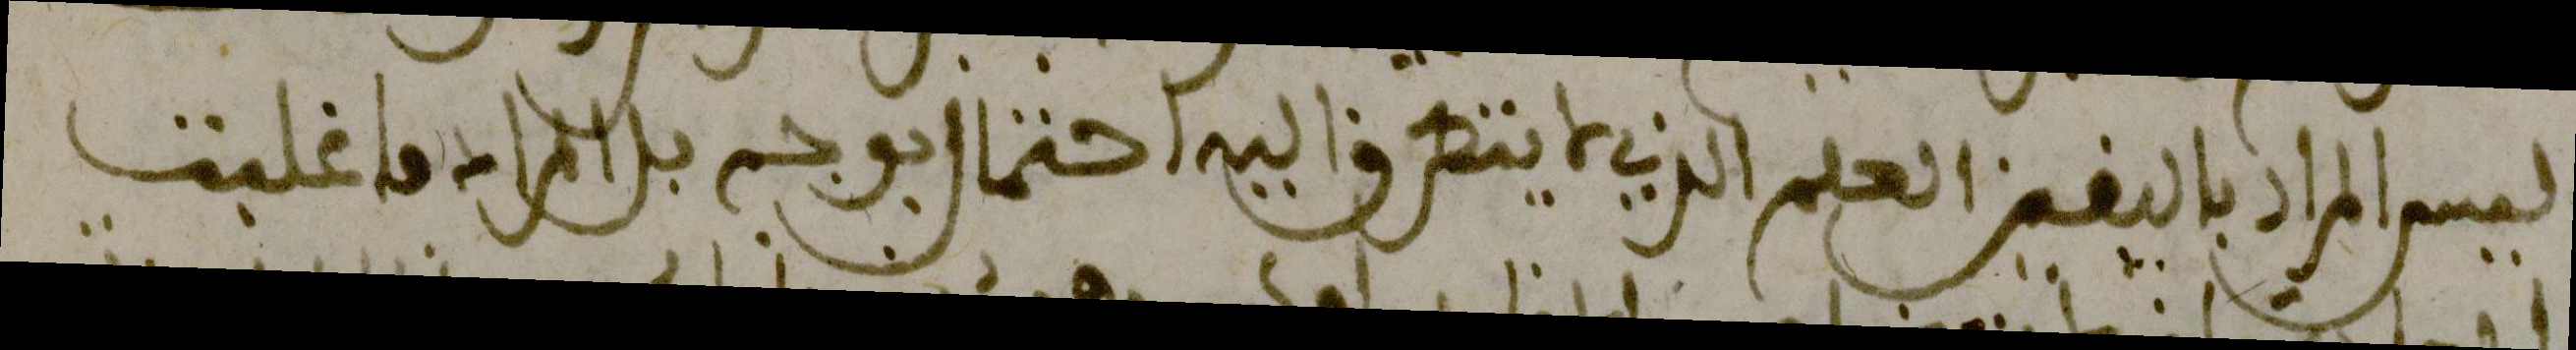ليس المراد باليقين العلم الذي لا يتطرق اليه احتمال بوجه بل المراد ما غلبت
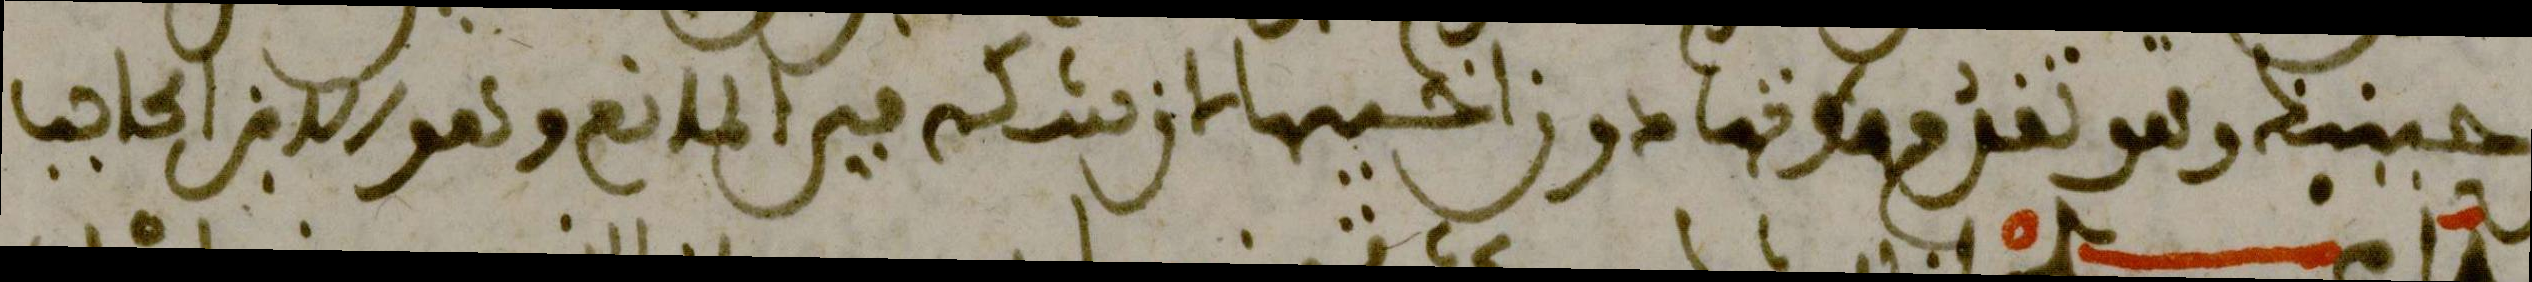حينئذ وهو تقدم موتها دون اخيها لان شكه في المانع وهو الابن الحاجب
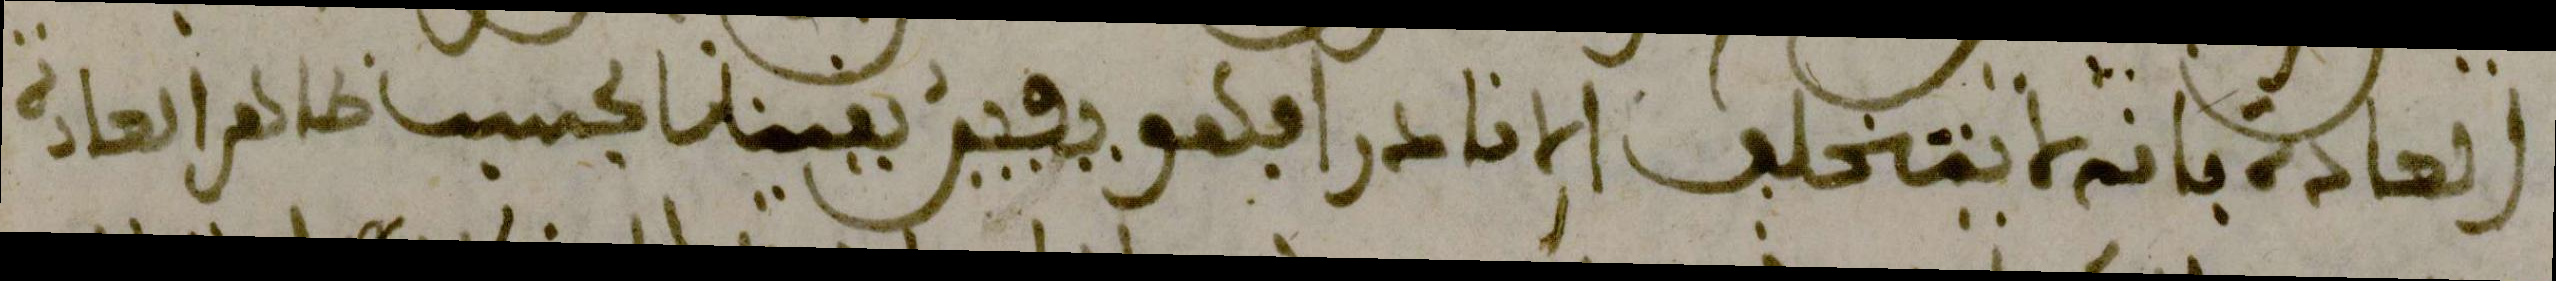العادة فانه لا يتخلف الا نادرا فهو يفيد يقين يقينانا بحسب ظاهر العادة
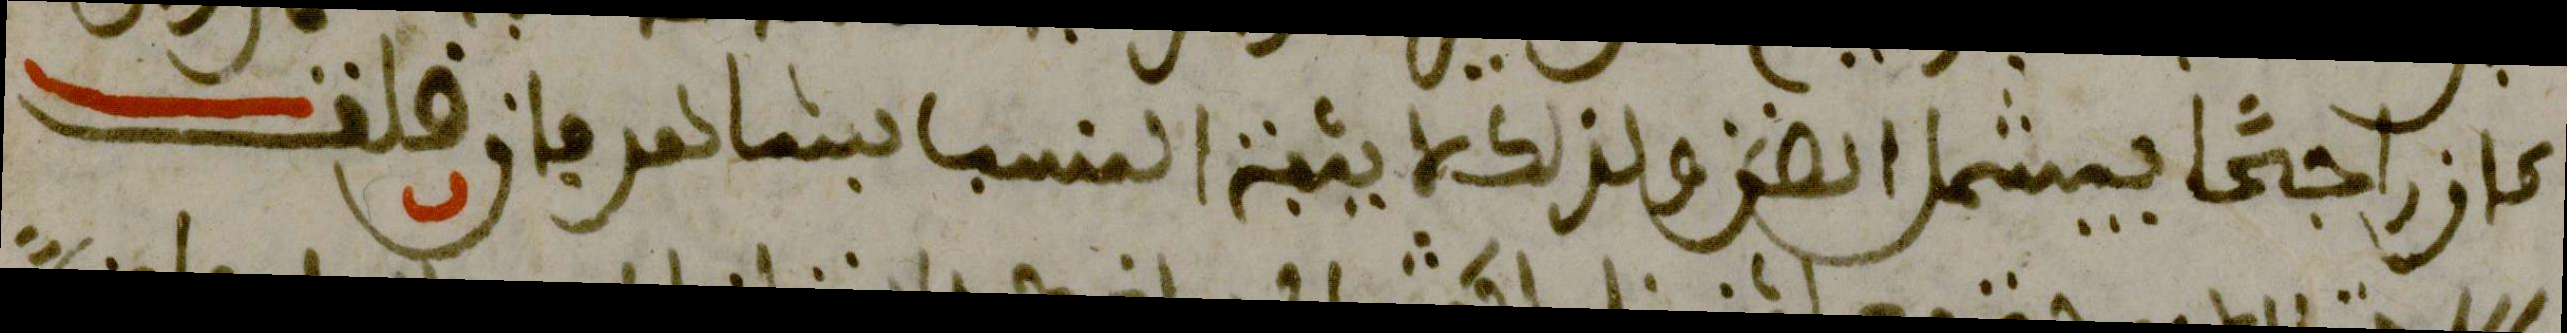كان راجحا بيشمل الضن ولذلك لا يثبة النسب بشاهد فان قلت
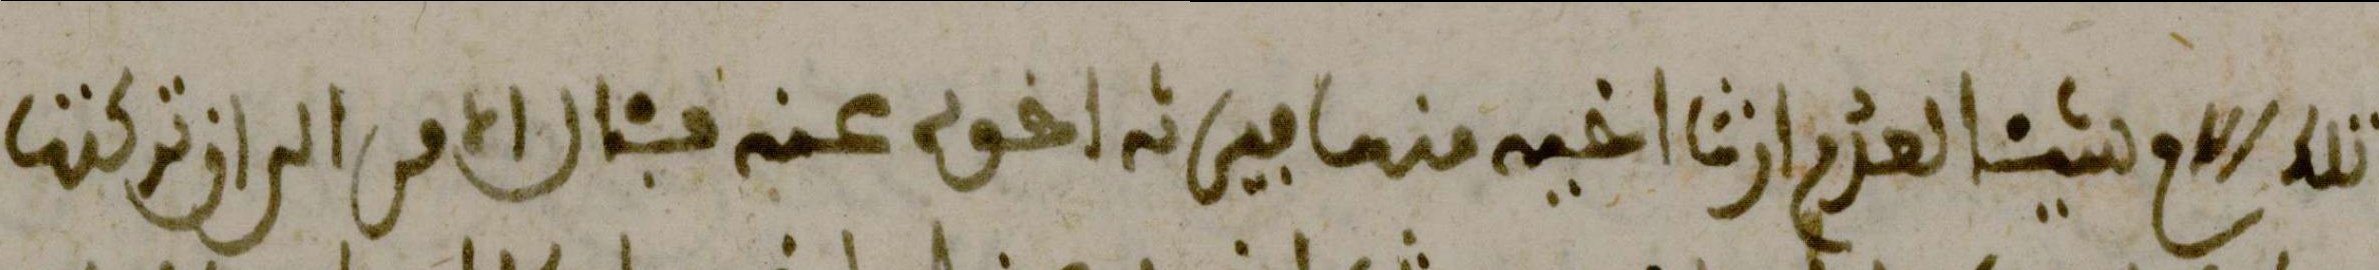تلك الام شيئا العدم ارث اخيه منها فيرثه اخوه عنه فئال الامر الى ان تركتها
